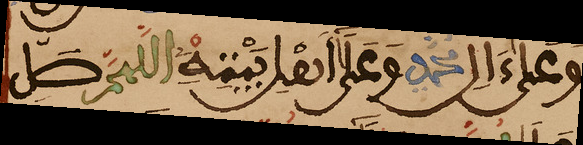و على ءال محمد و على أهل بيته اللهم صل
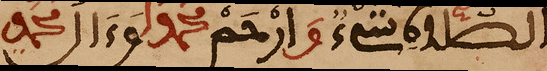الصلاة شيء و ارحم محمدا و ءال محمد
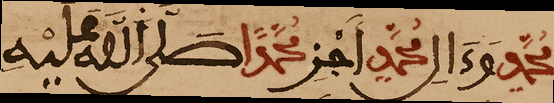محمد و ءال محمد صلى الله عليه
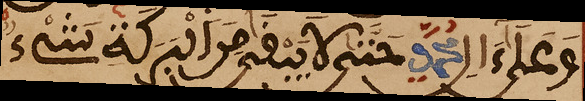و على ءال محمد حتى لا يبقى من البركة شيء
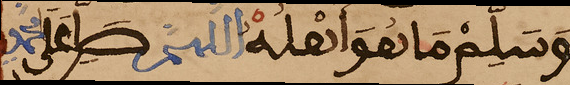و سلم ما هو أهله اللهم صلي على محمد
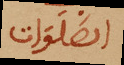الصلوات
